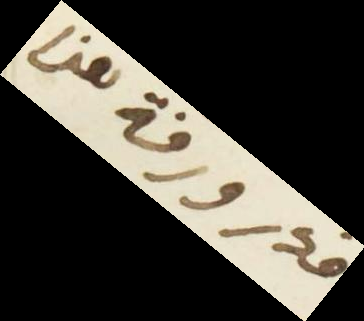قدر ورقة هنا
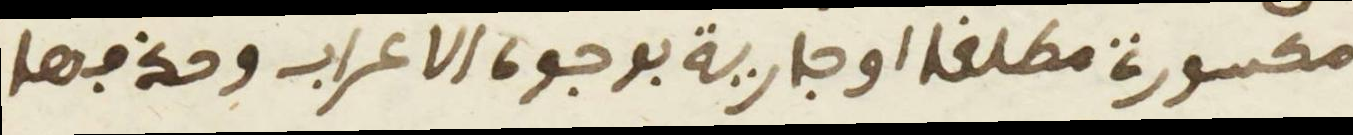مكسورة مطلقا او جارية بوجوه الاعراب و حذفها
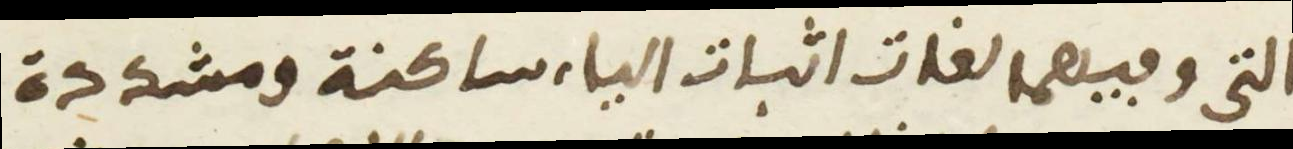التي و فيهما لغات اثبات الياء ساكنة و مشددة
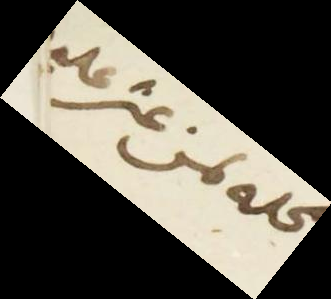محله لمن عثر عليه
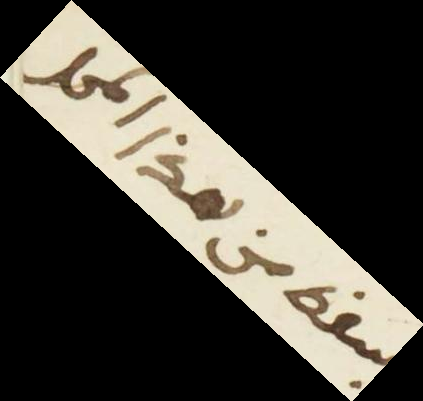سقط من هذا المحل
